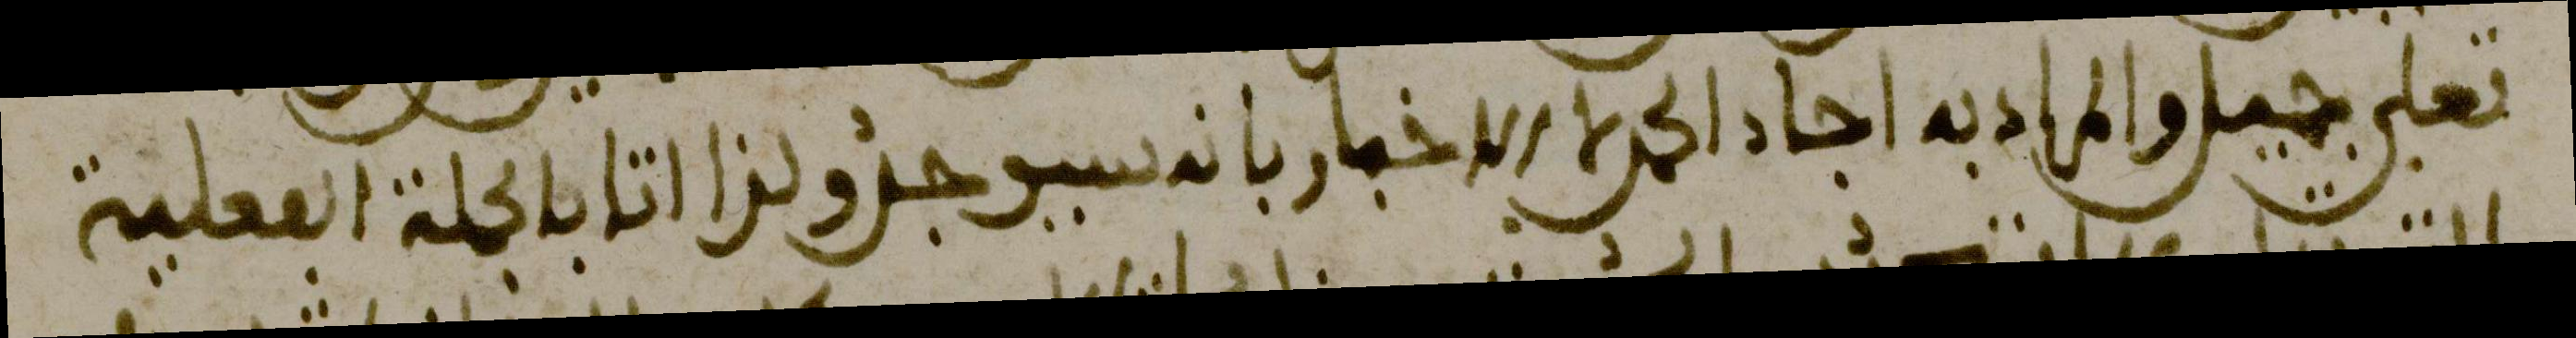تعلى جميل والمراد به اجاد الحمد لا الاخبار بانه سيوجد ولذا اتا بالجملة الفعلية
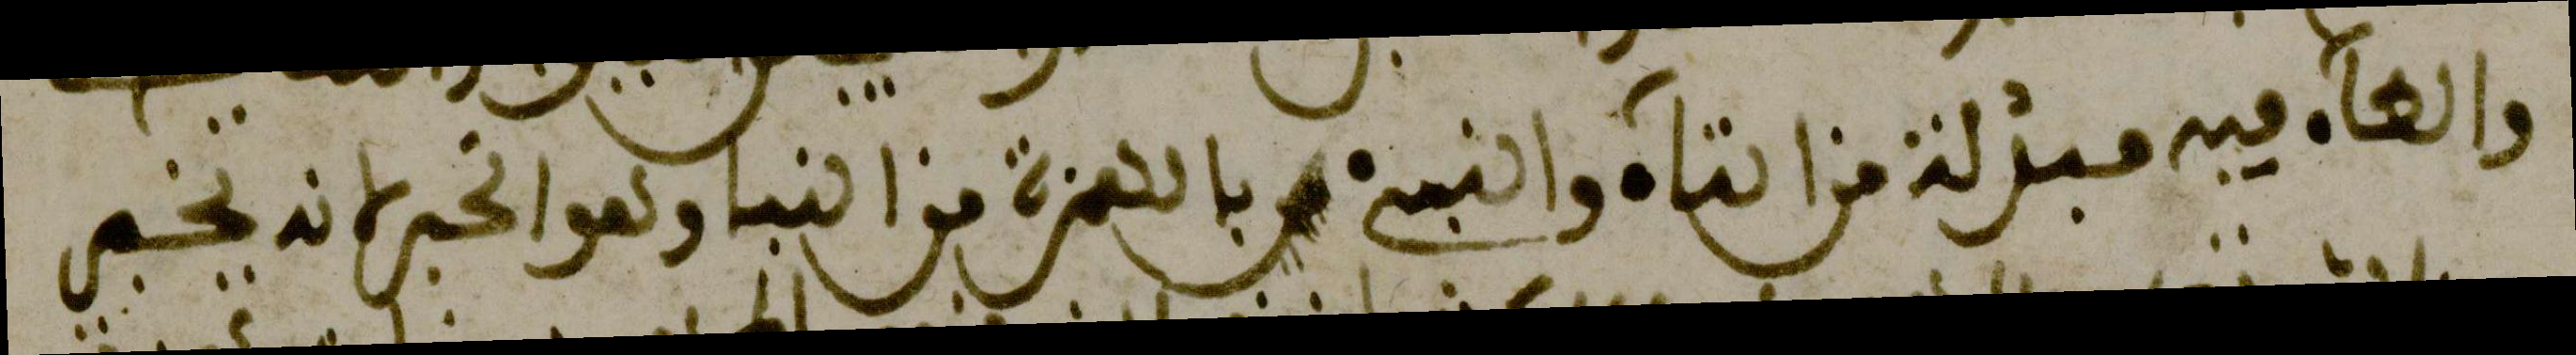الطاء فيه مبدلة من التاء والنبئ بالهمزة من النبا وهو الخبرلانه يجبر
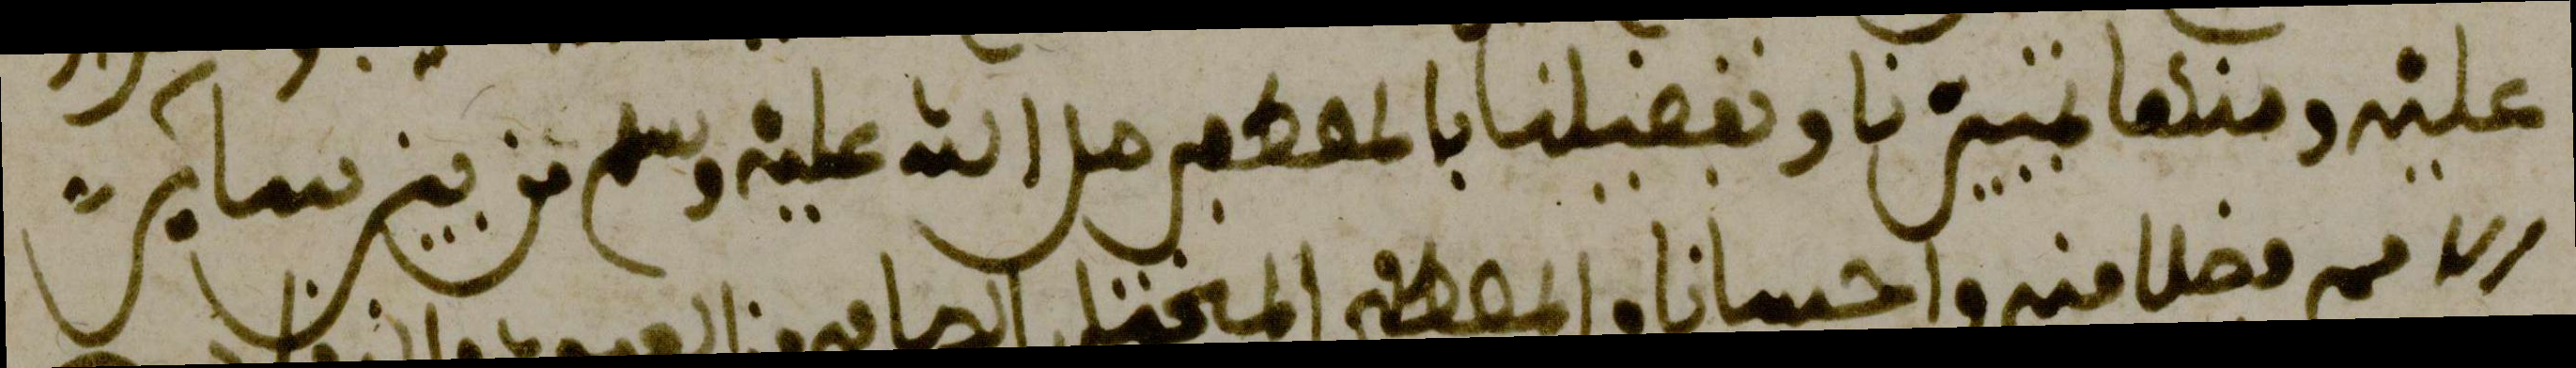عليْه ومنها تمييزنا وتفضيلنا بالمصطفى صل الله عليْه وسلم من بين سائر
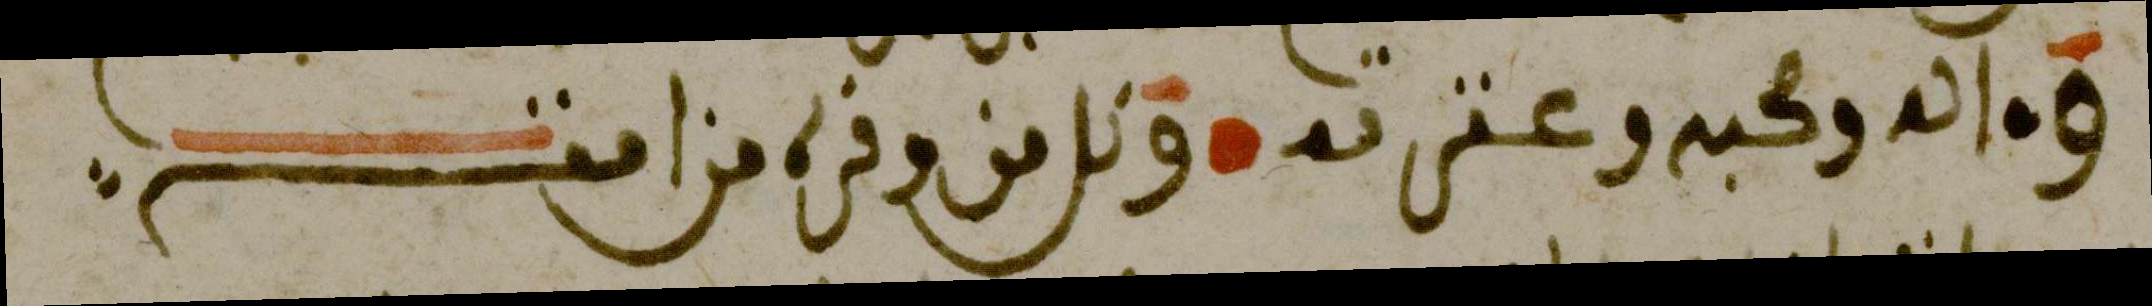وَءاله ومحبه وعترته وَكل من وقره من امته
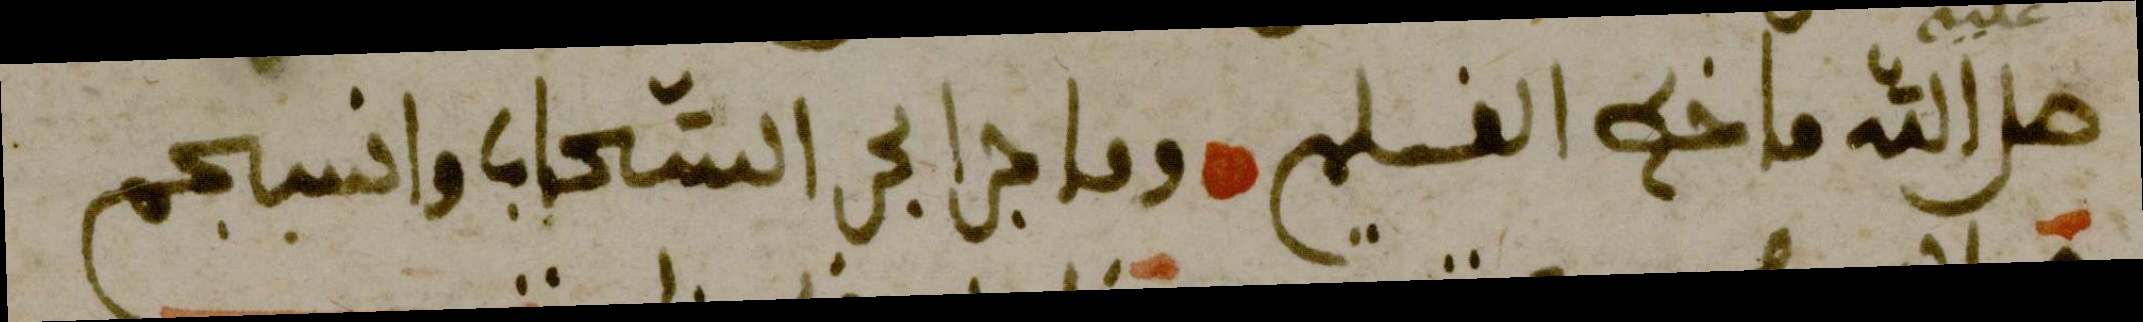صل الله ماخط القلم وما جرا مجر السّحاب وانسجم
